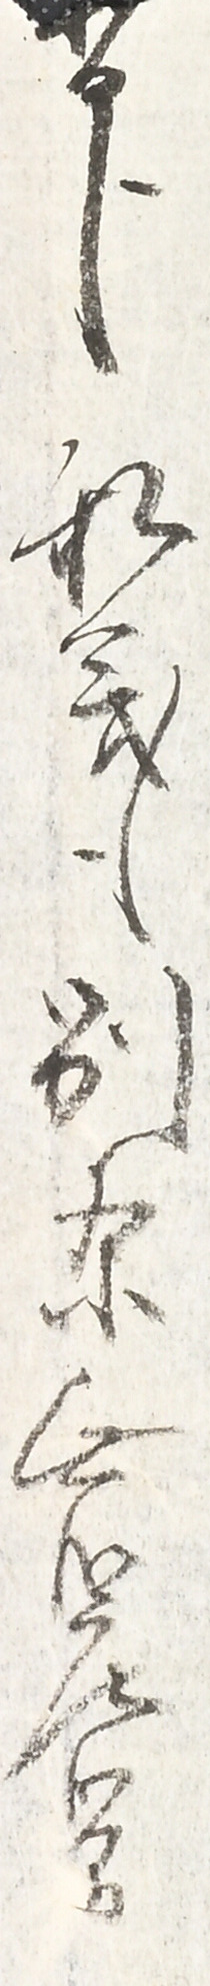々私義も別条無御座候間
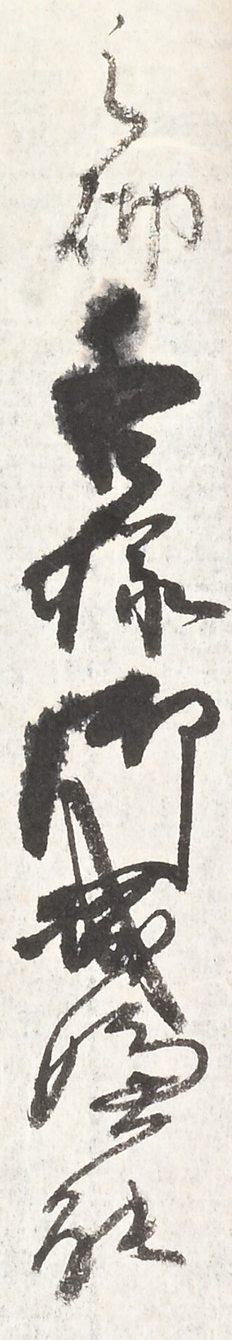之砌各様御城嫌能
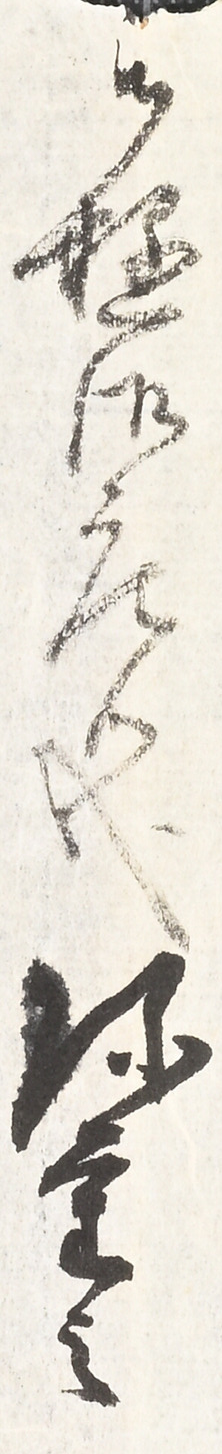被遊御座候哉珍重之
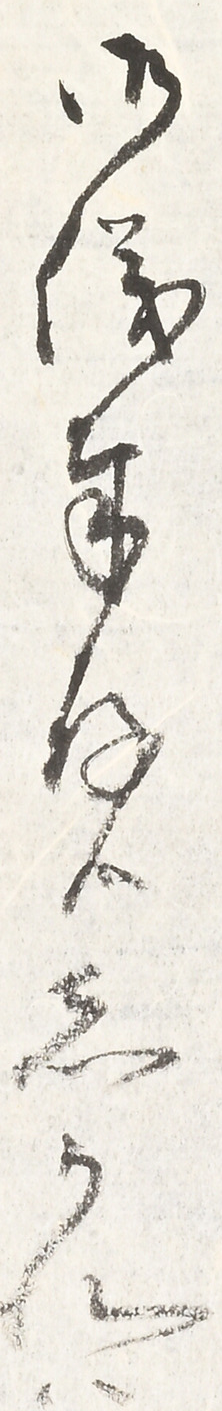御儀奉存候しかれは
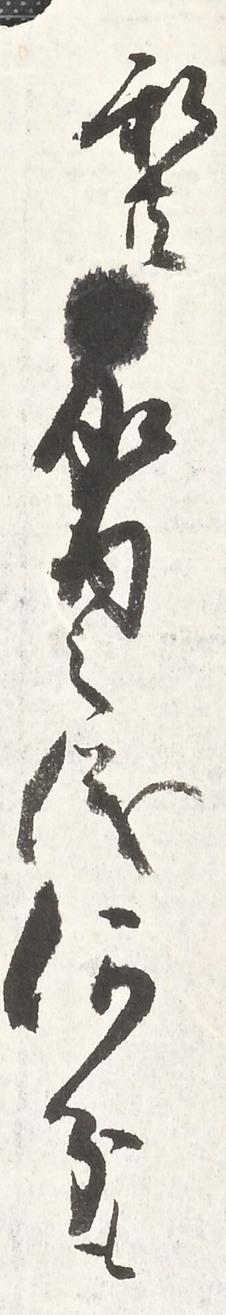私共家内之儀何分も
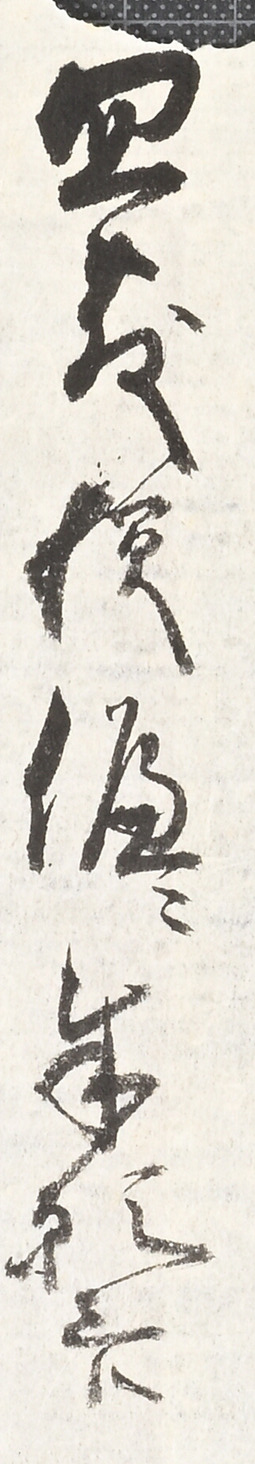宜敷様偏に奉願上候
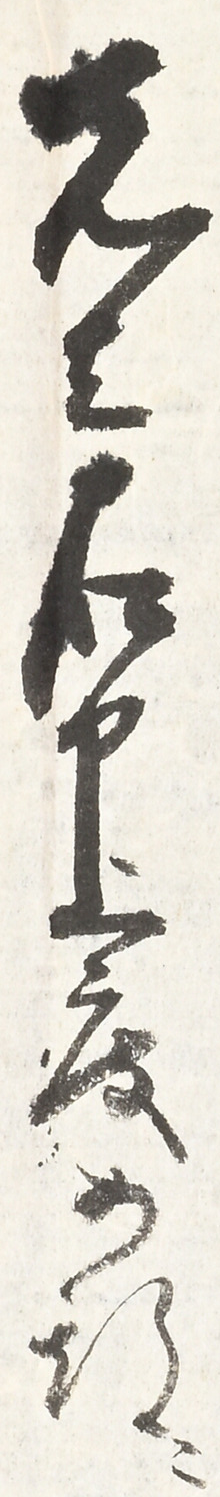先は右申上度如斯に
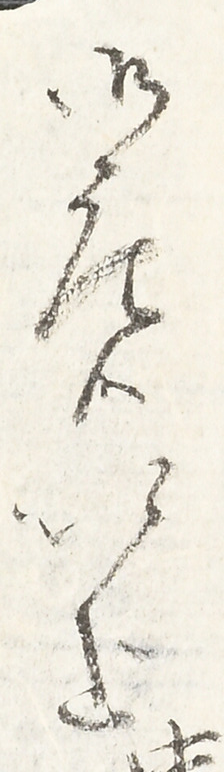御座候以上
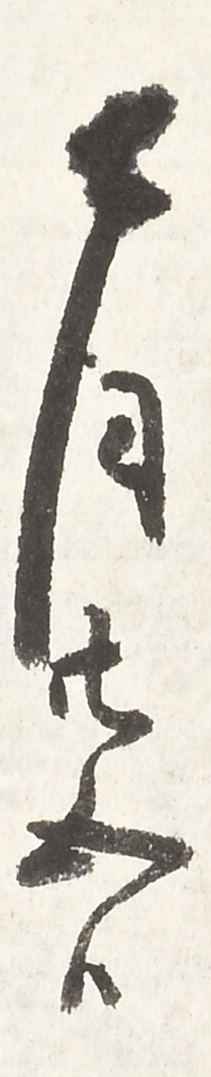七月廿五日
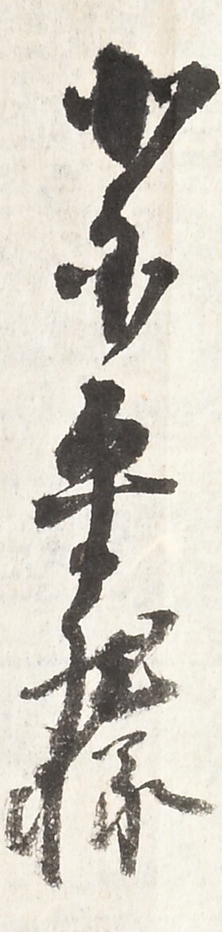北原平蔵様
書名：（書状）
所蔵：伊那市立高遠町図書館・合同会社AMANE
